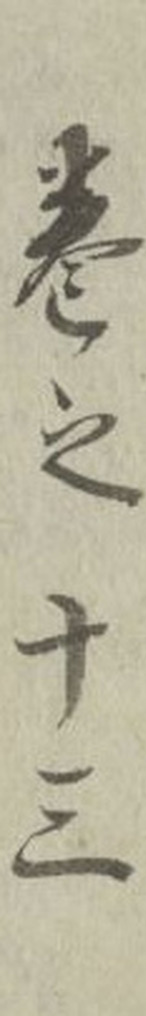巻之十三
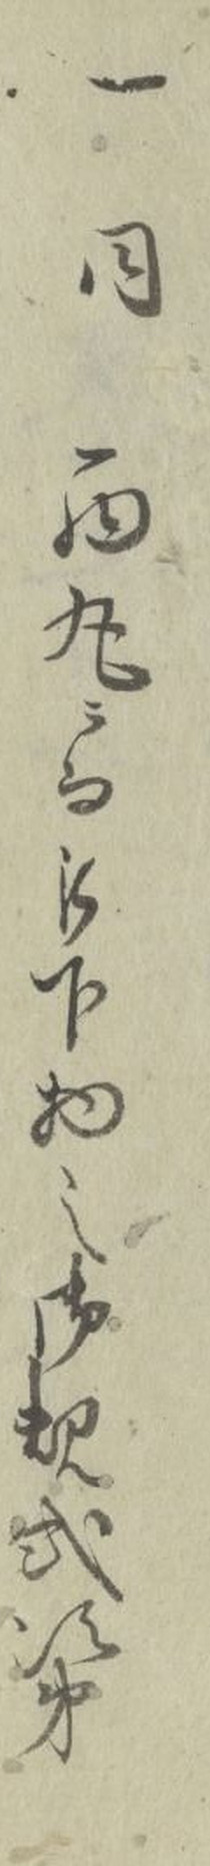一同西丸に而被下物之御規式之次第
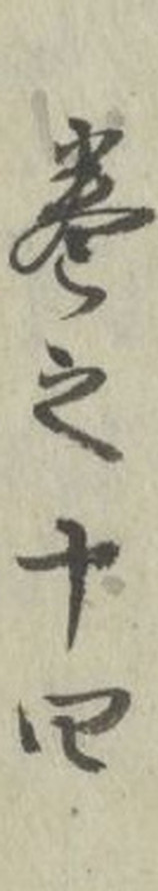巻之十四
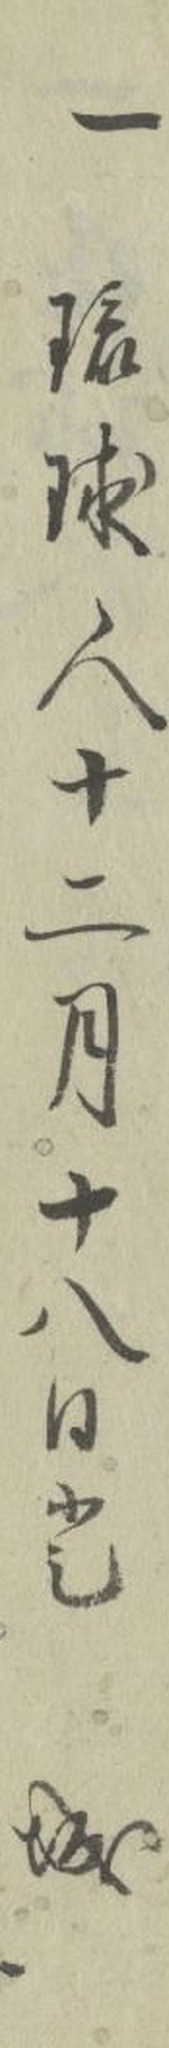一琉球人十二月十八日登城有之
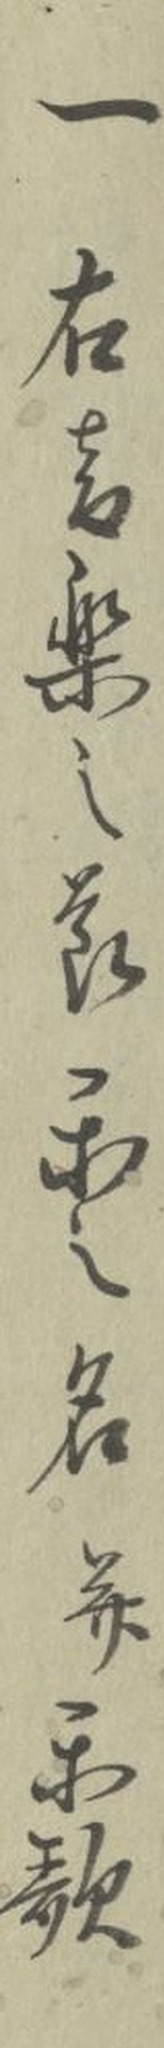一右音楽之節楽之名幷楽歌
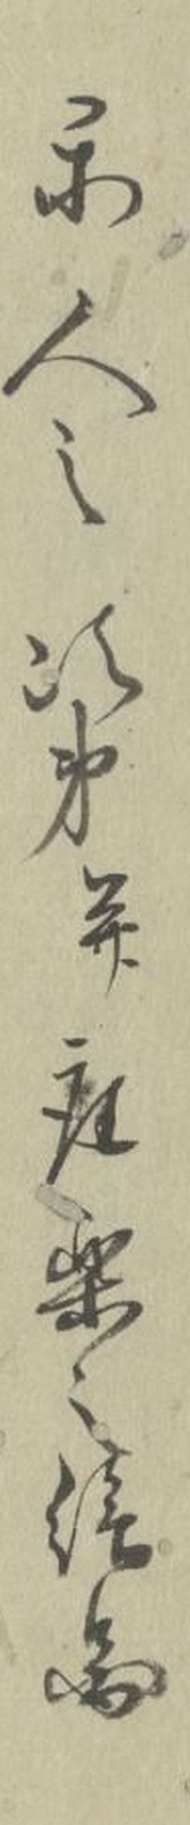楽人之次第幷座楽之絵図
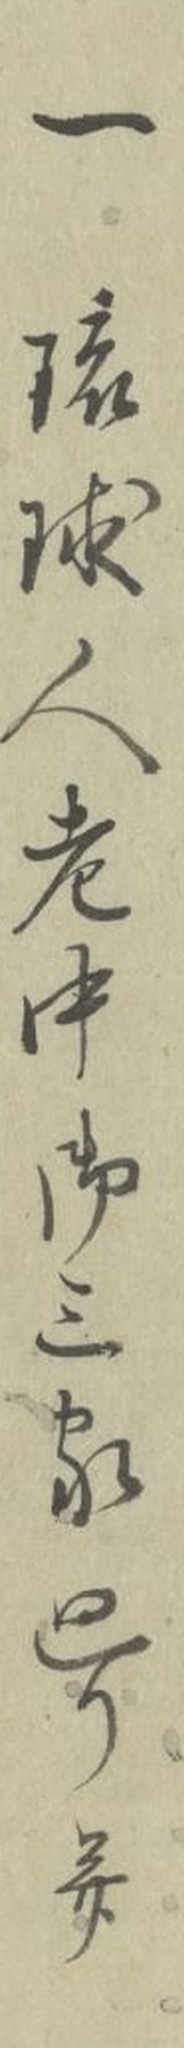一琉球人老中御三家廻り幷
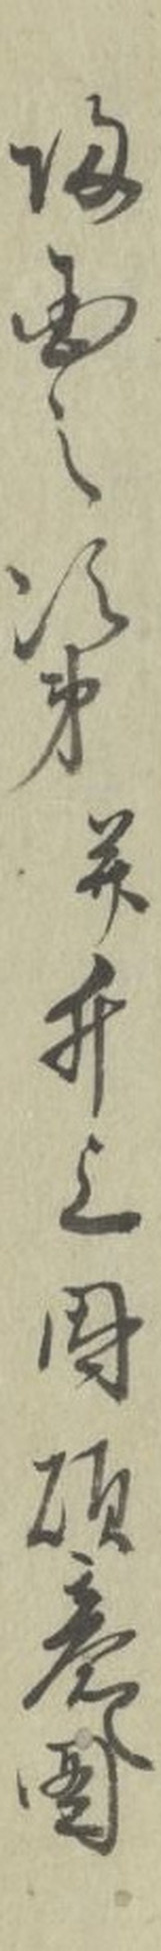帰国之次第幷井上因碩碁之図

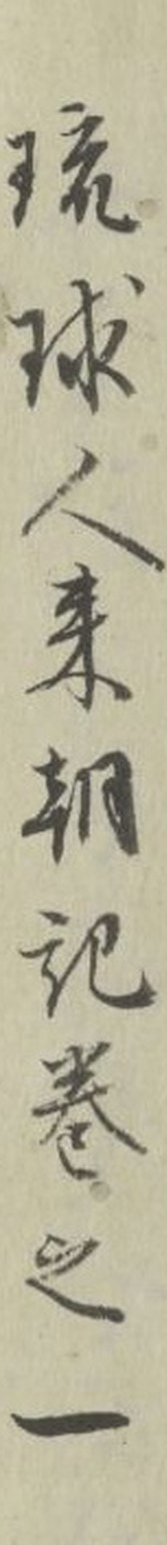琉球人来朝記巻之一
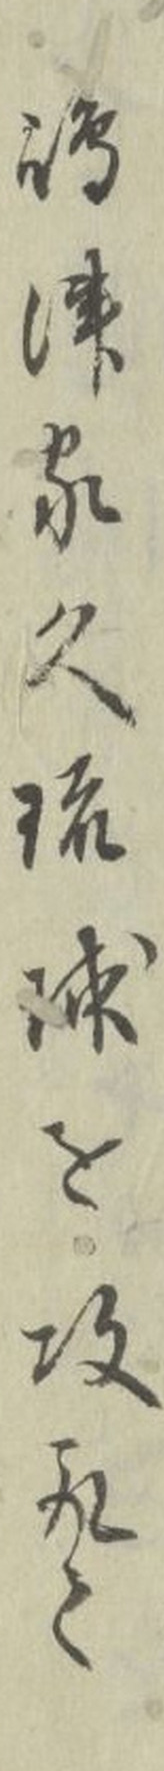島津家久琉球を攻取て
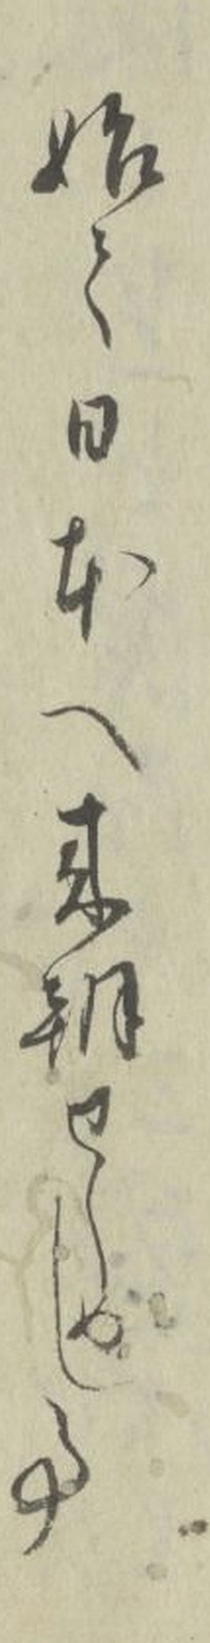始て日本へ来朝せしめし事
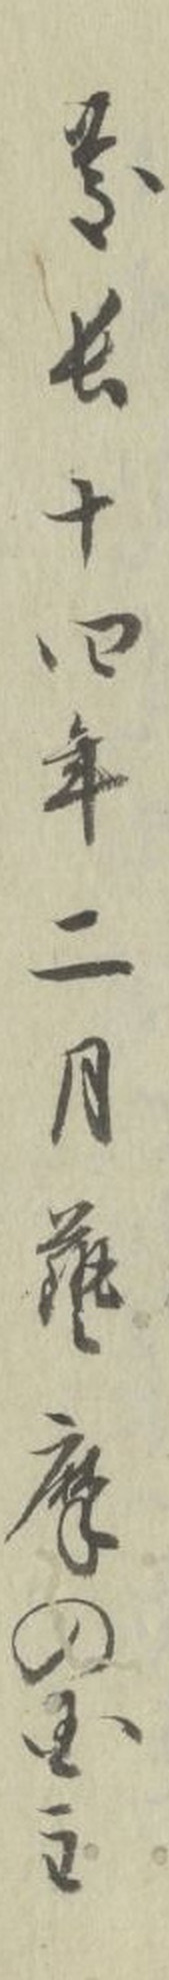慶長十四年二月薩摩の国主
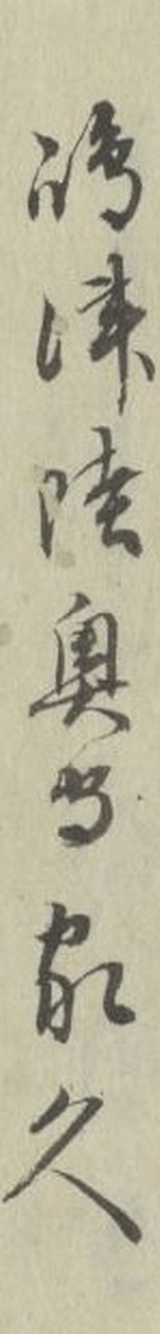島津陸奥守家久
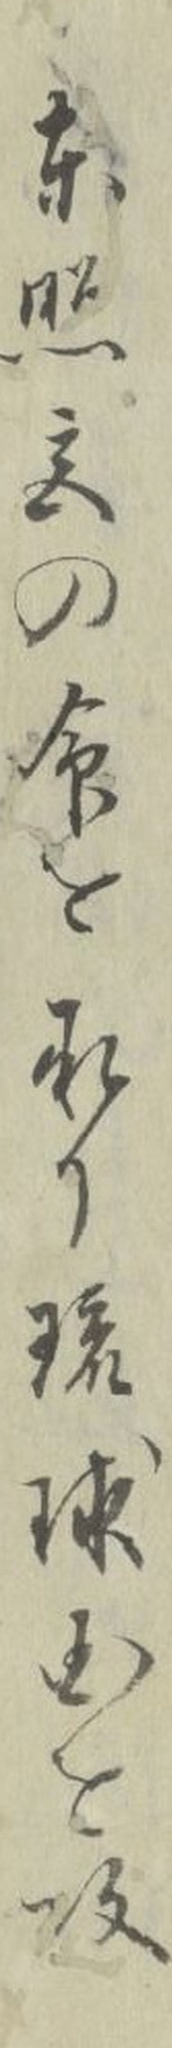東照宮の命を承り琉球を攻

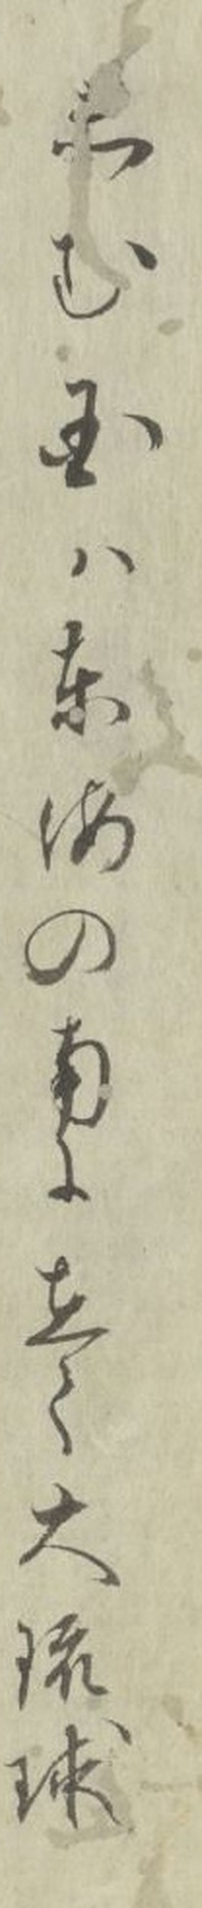しむ国は東海の南に在て大琉球
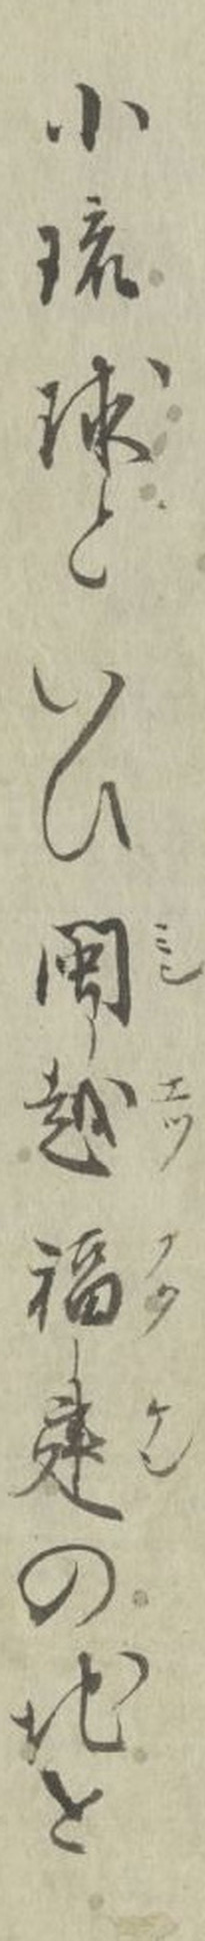小琉球といひ閩越福建の地を
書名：琉球来朝記 自一至七
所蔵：University of the Ryukyus Library
